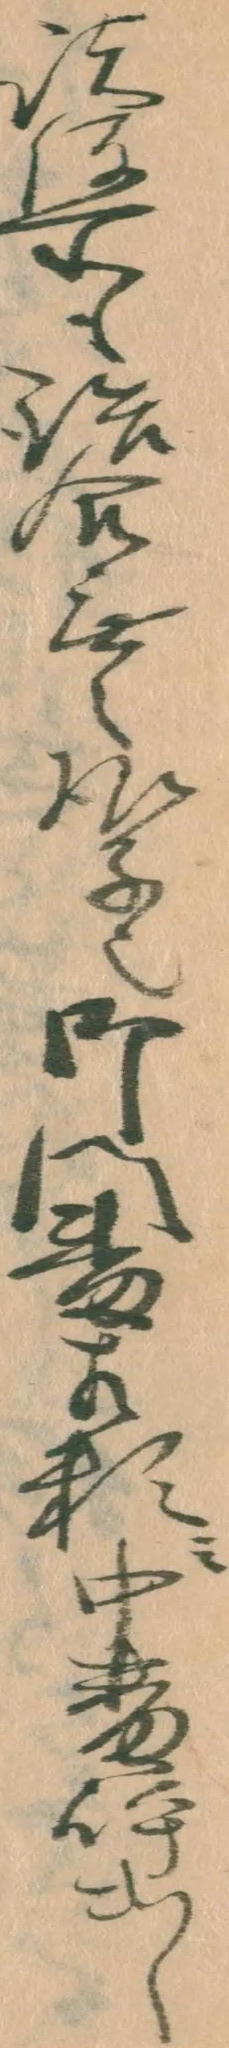諸役所も詰合無之様子也御門番相頼ミ中番呼出し
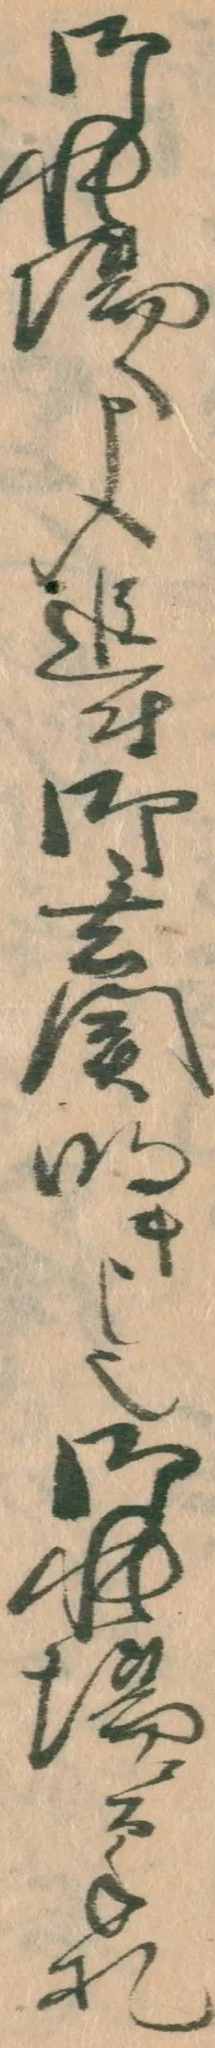御帳場へ申入追付御玄関明キ申也御帳場ニ而手札
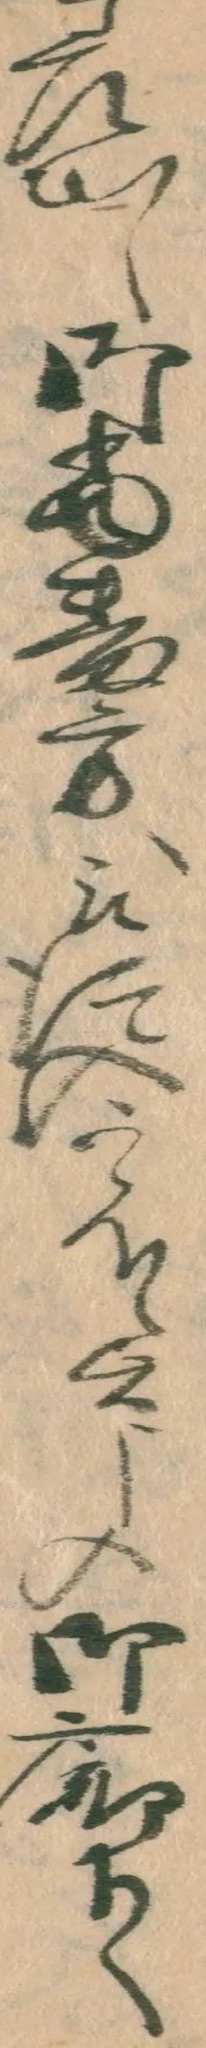差出し御当番方へ被仰入可被下候旨申入御廊下へ
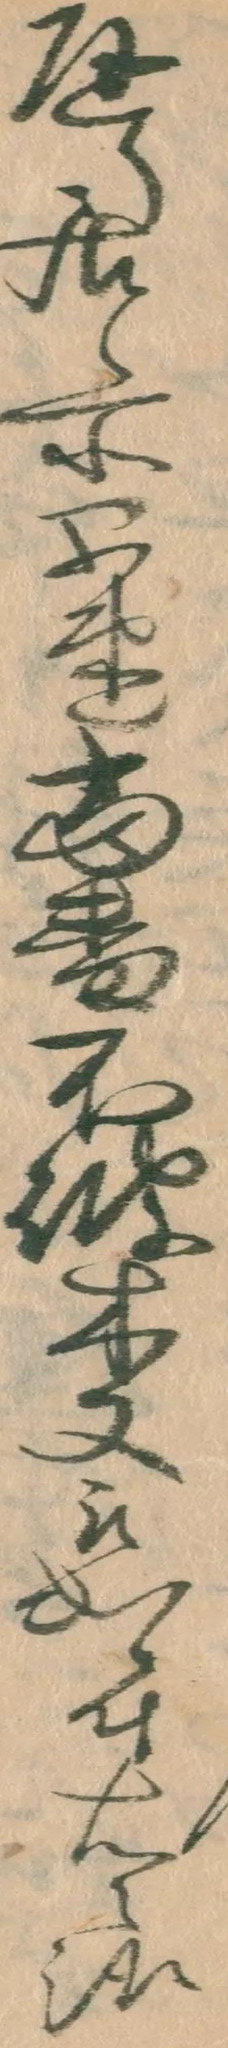通り居候所早速当番不破木又被出候付右之趣
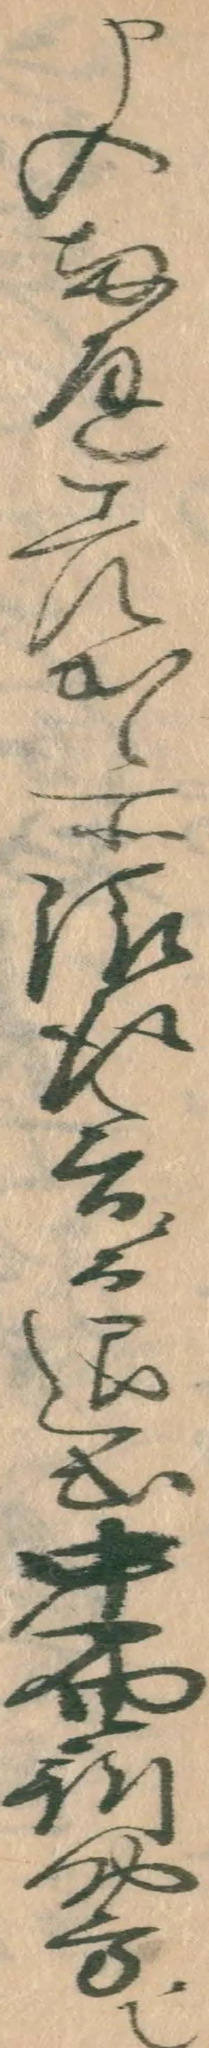申入両通差出候所請取旨ニ而退出中宿利助方ニて
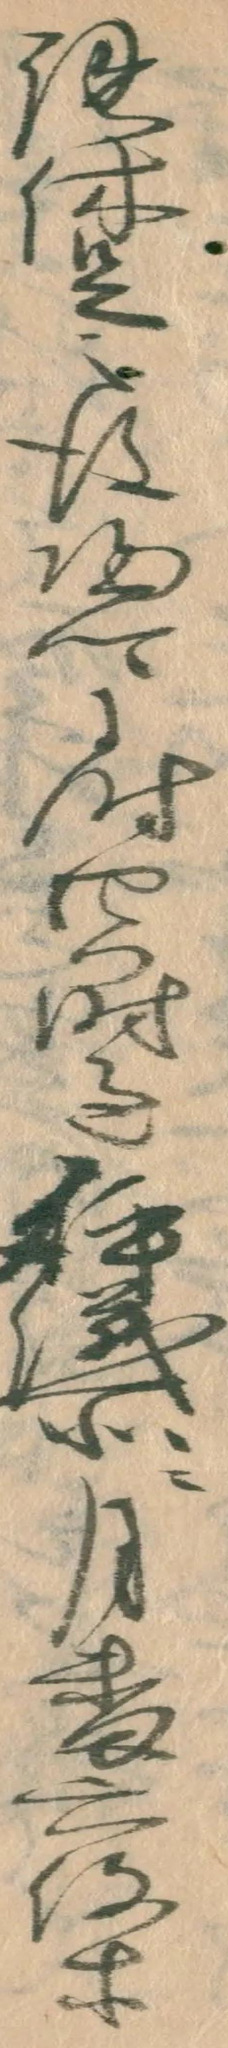認休足之後帰郷于時四つ時過評議所ニ月番六役等
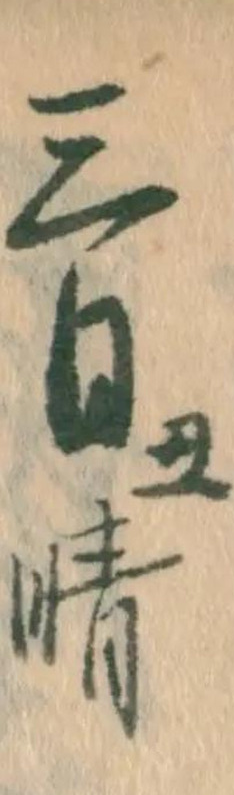三日丑晴
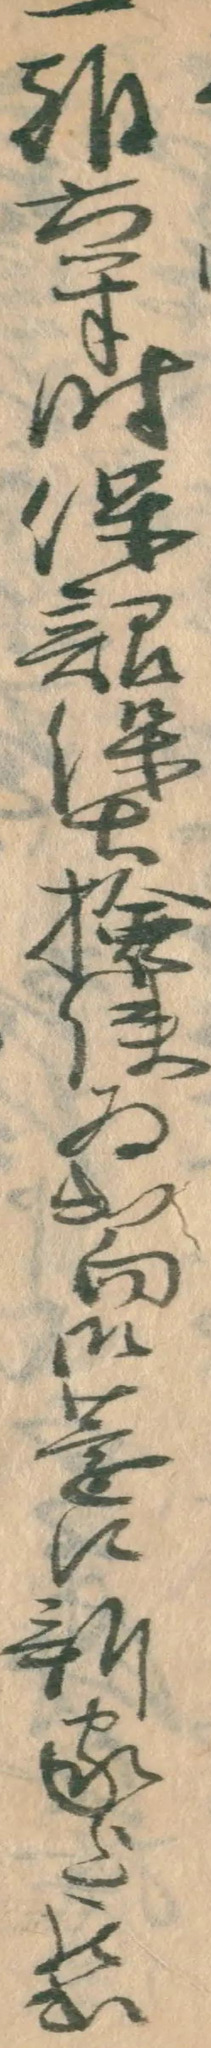一朝六ツ半時保韶保土検使為出向御薗口新家迄罷出
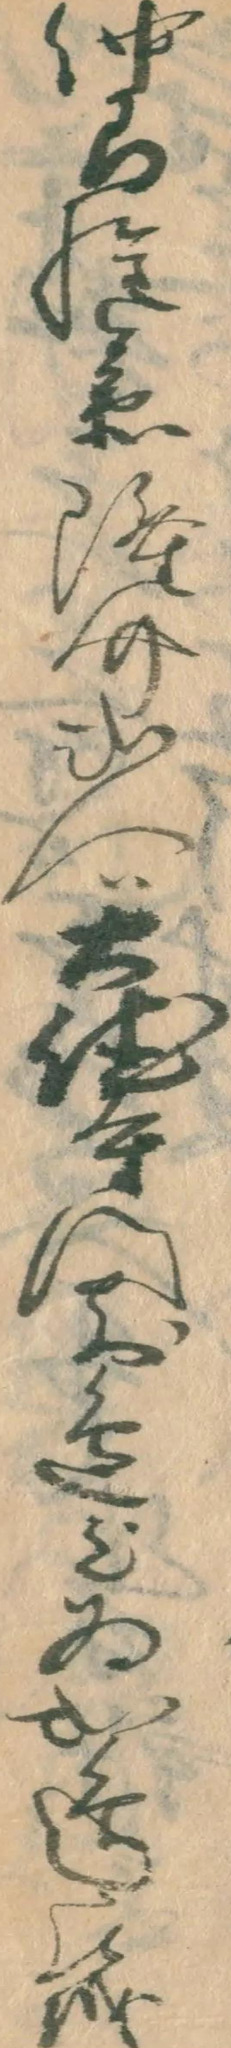仲間権兵衛隆介弐人ハ大徳寺門前辺迄為出迎罷越

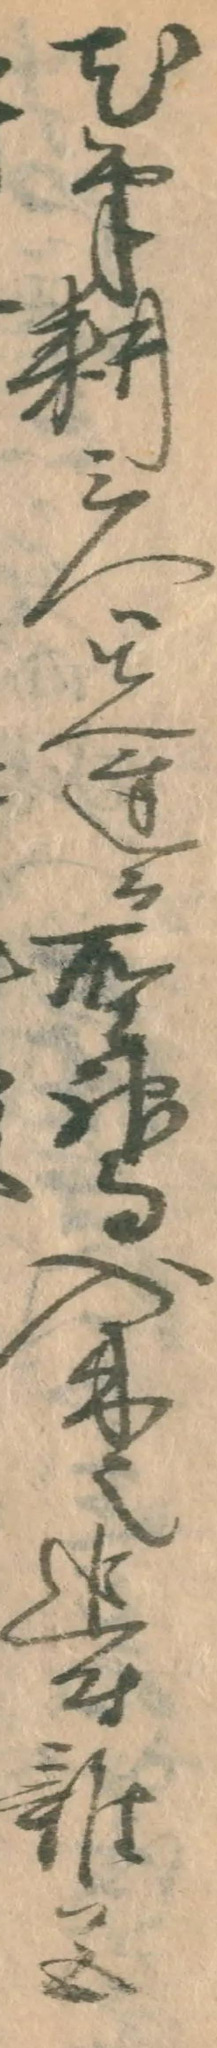尤筆耕三人ハ先達而聖神寺へ入来也追付雑色
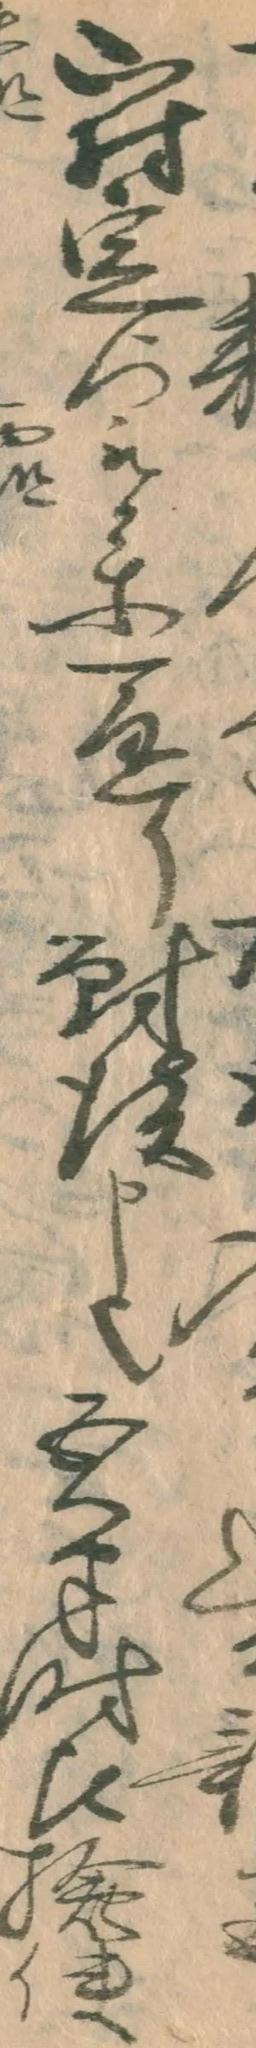山村定右衛門被参一通り対談申也五ツ半時比検使
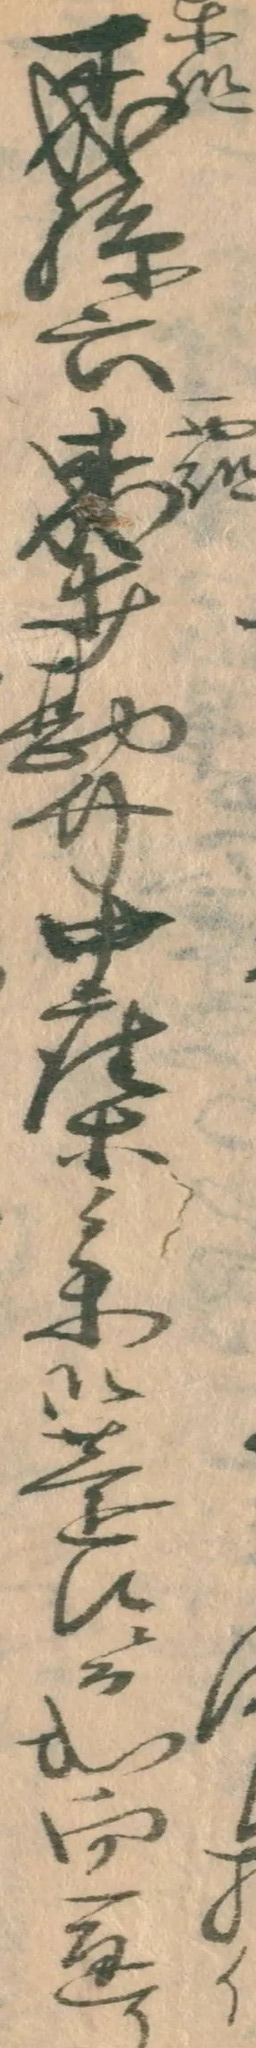東組森孫六西組森井勘介中座等参御薗口ニ而出向一通り
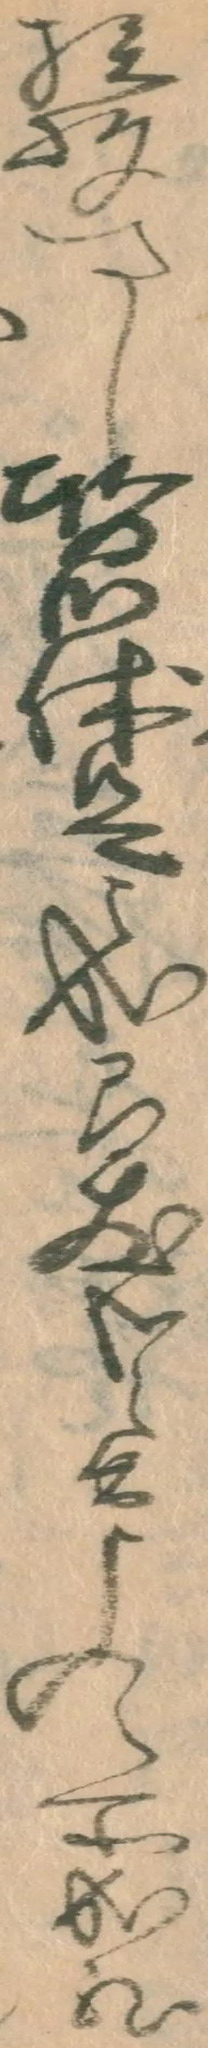挨拶いたし暫御休足被成間敷哉之旨申入候所成程
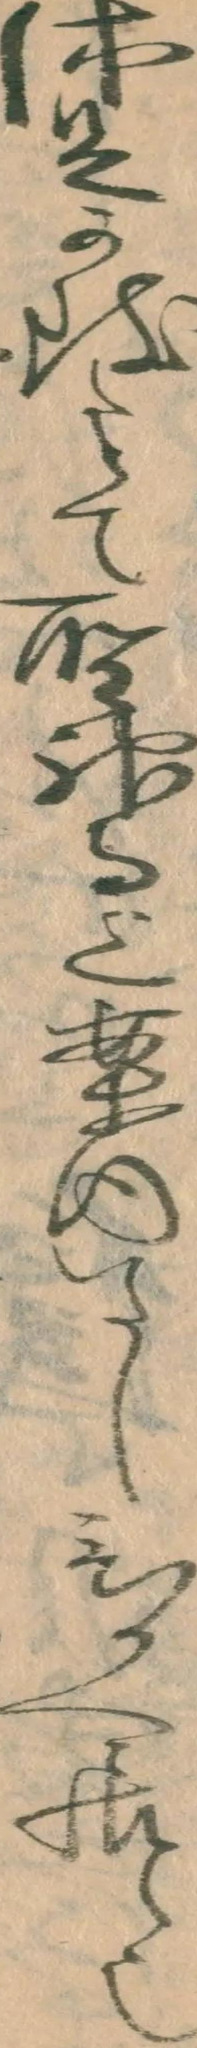休足可致とて聖神寺迄案内いたしひかへ居候也
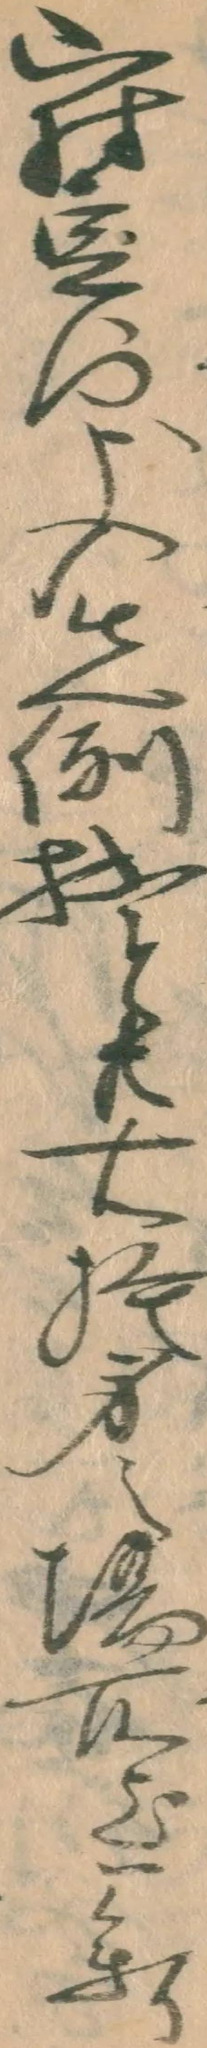山村定右衛門へ申入先例拙者共右捨身之場所迄参り
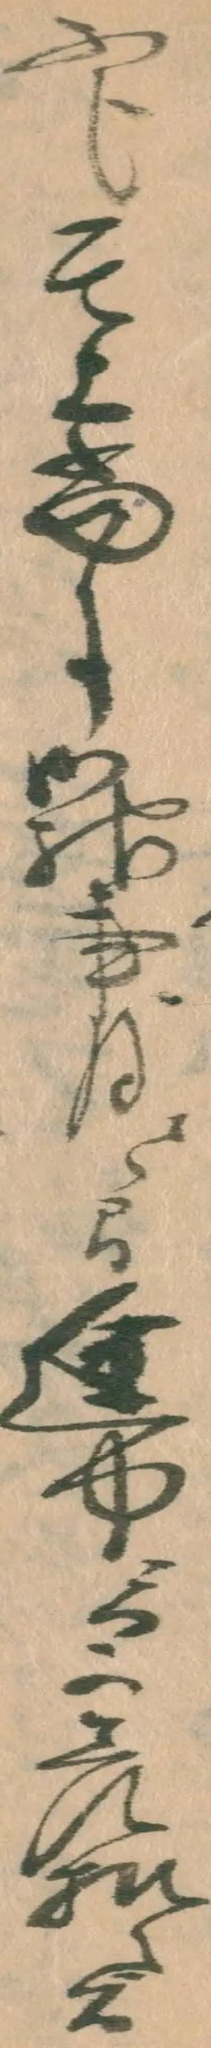不申候其上当月御神事月ニ候間途中ニ而可差扣候旨
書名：賀茂社記録. 第60冊
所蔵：国立国会図書館 National Diet Library, JAPAN
